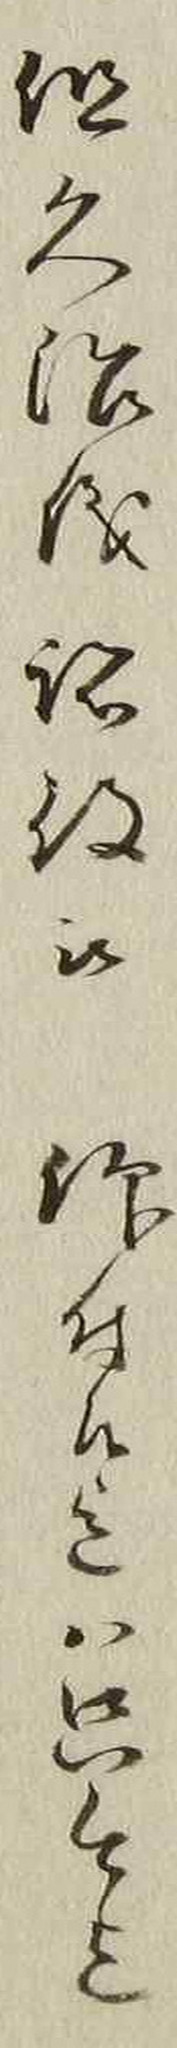但久治儀跡役被仰付候迄ハ只今迄
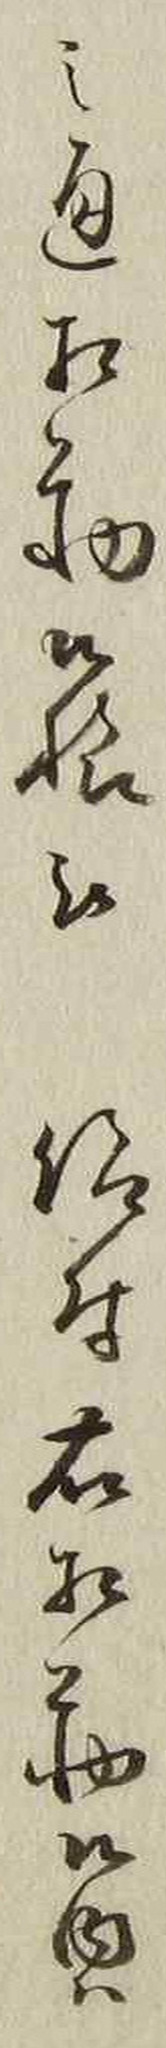之通相勤候様被仰付右相勤候内ハ
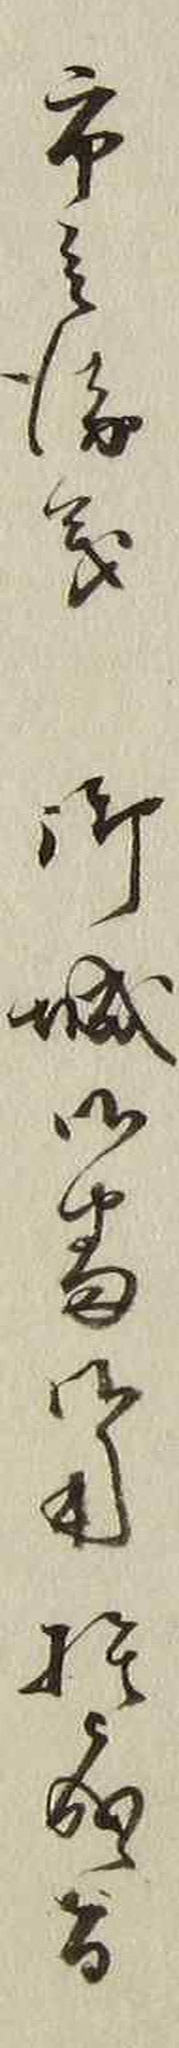市兵衛義御城御番御用捨被成候旨
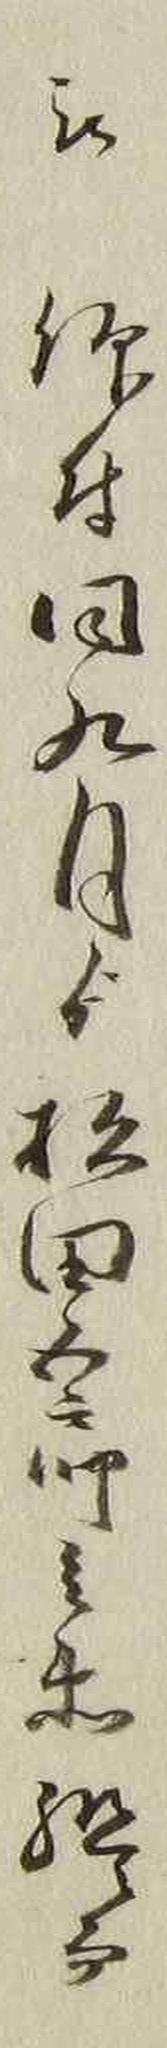被仰付同九月ゟ杉田五郎兵衛組ニ而
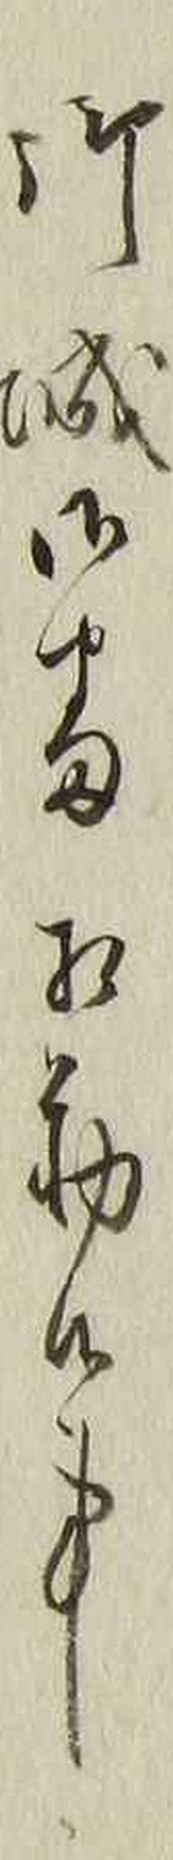御城御番相勤候事
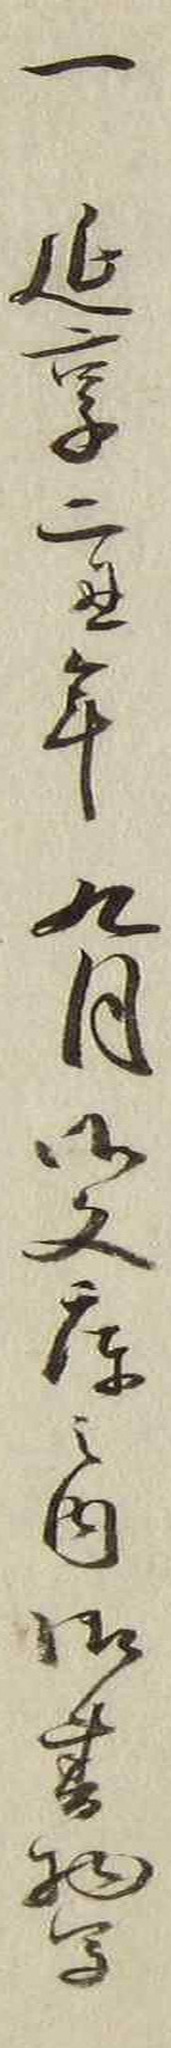一延享二丑年九月御文庫之内御書物写

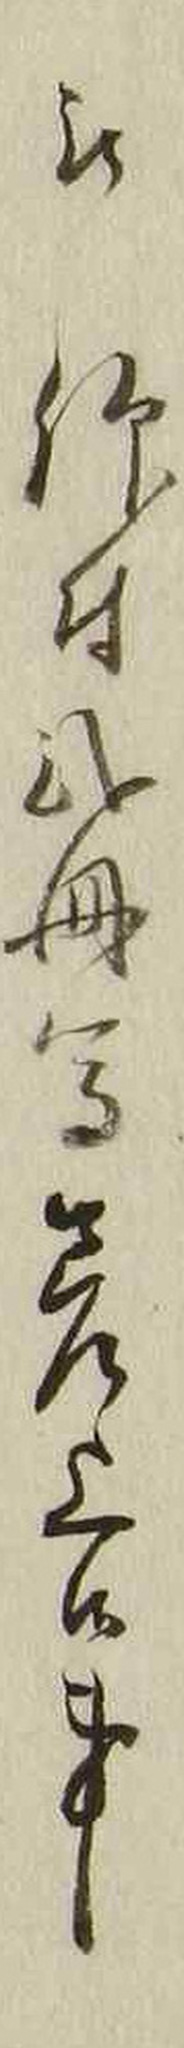被仰付弐冊写差上候事
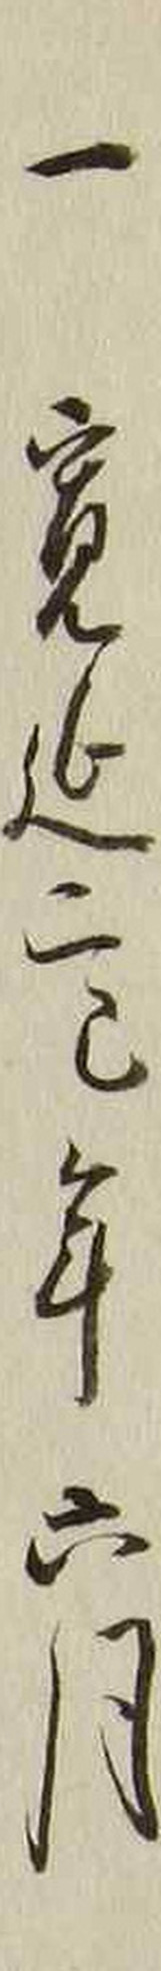一寛延二巳年六月
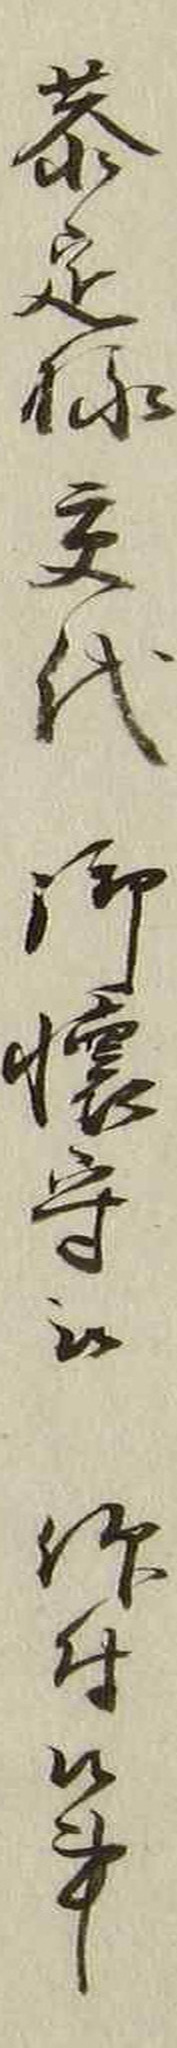恭定様交代御懐守被仰付候事
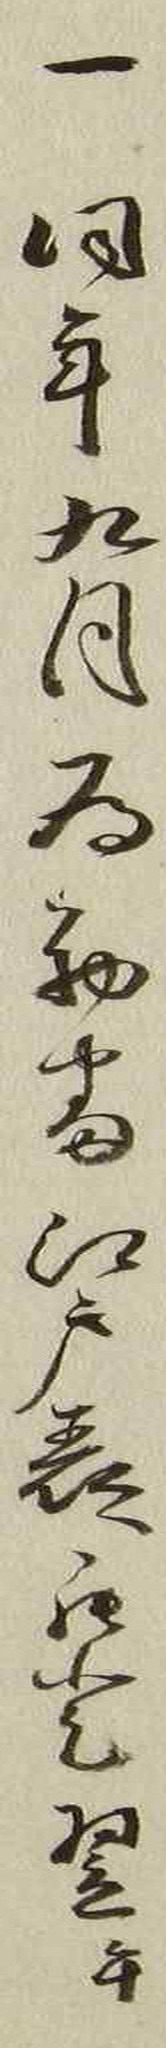一同年九月為勤番江戸表へ罷登翌午
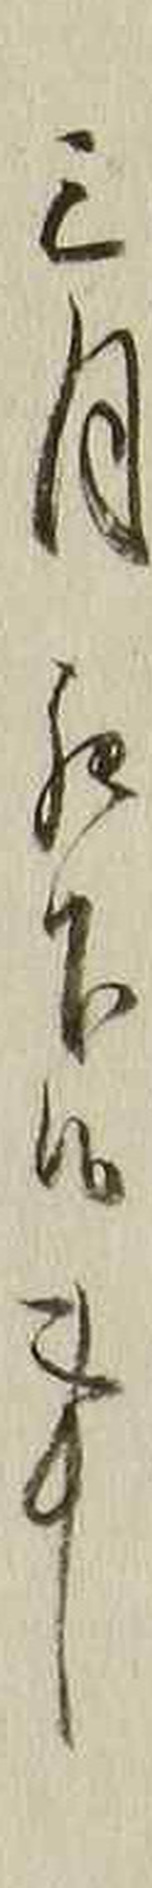三月罷下候事
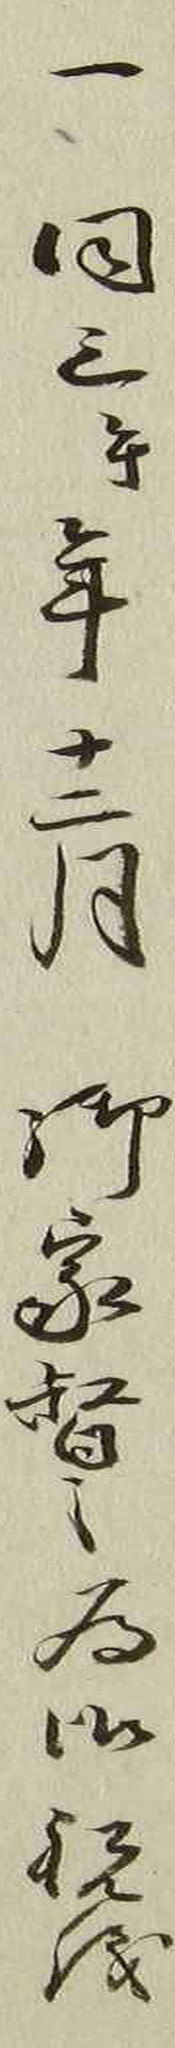一同三午年十二月御家督之為御祝儀
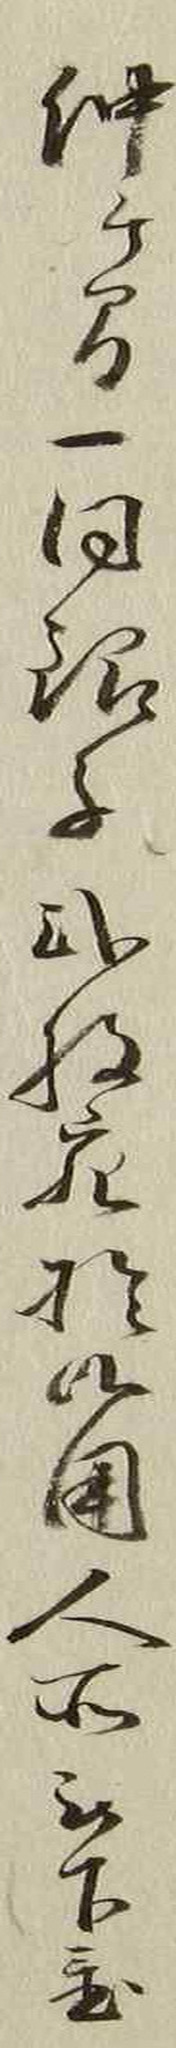仲ケ間一同銀子弐枚宛於御用人所被下置
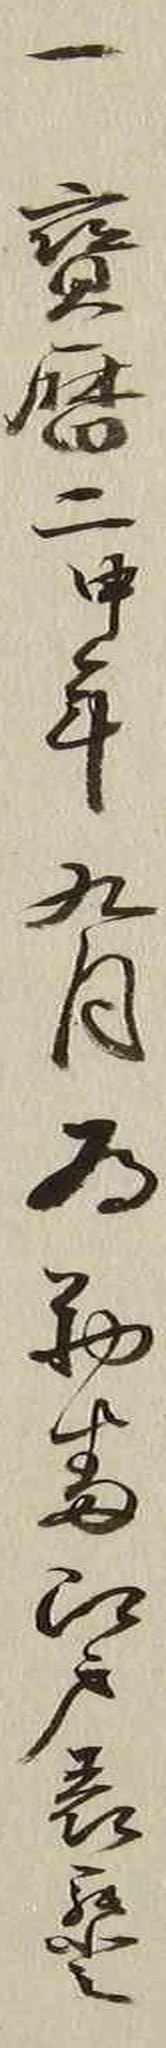一宝暦二申年九月為勤番江戸表罷登
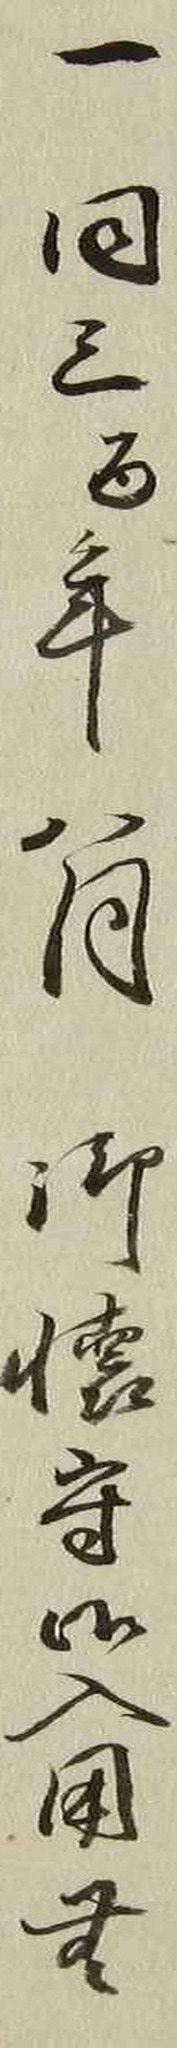一同三酉年八月御懐守御入用無
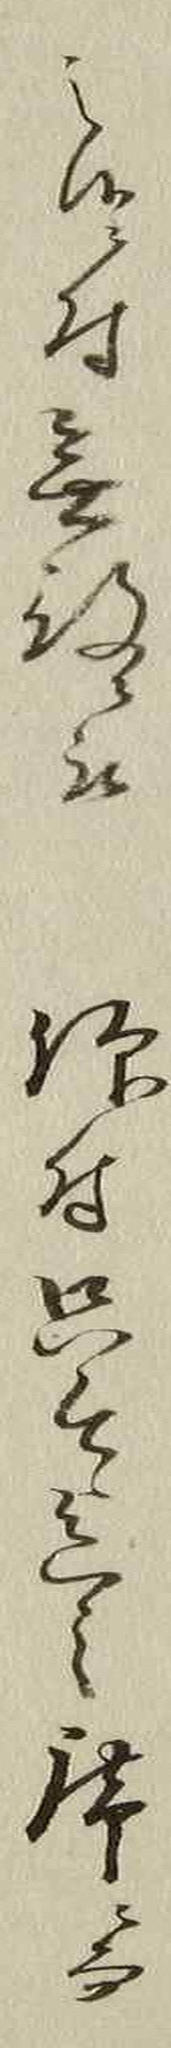之候ニ付無役ニ被仰付只今迄之席ニ而
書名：諸士系譜　巻之28　い之部28
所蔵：会津若松市立会津図書館
